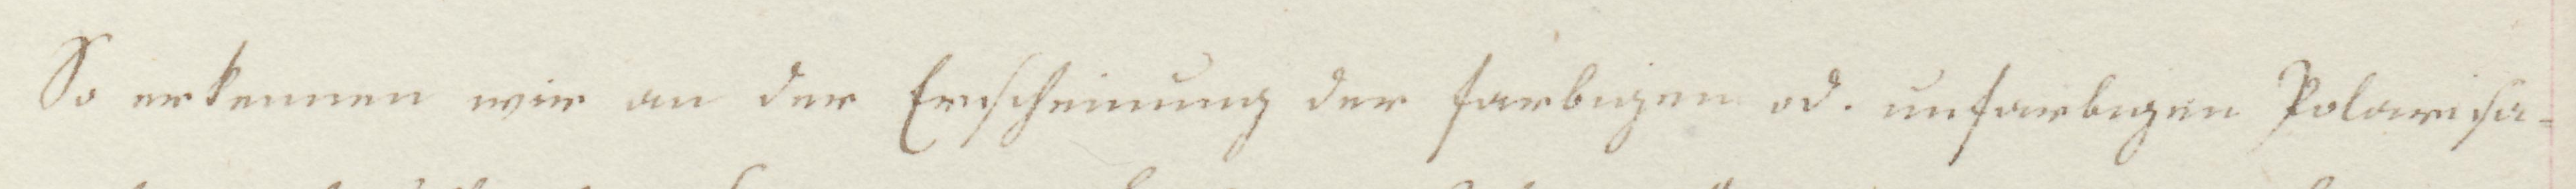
So erkennen wir an der Erscheinung der farbigen od. unfarbigen Polarisa-
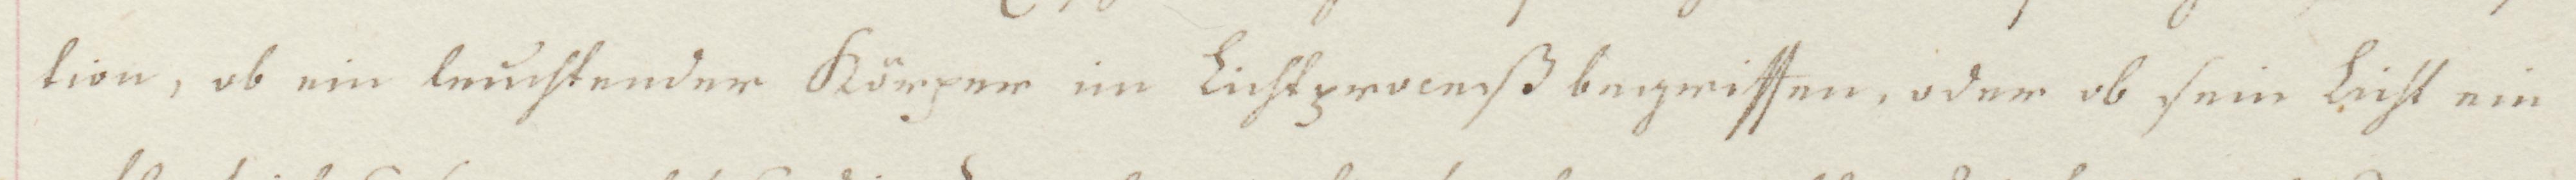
tion, ob ein leuchtender Körper im Lichtproceß begriffen, oder ob sein Licht ein
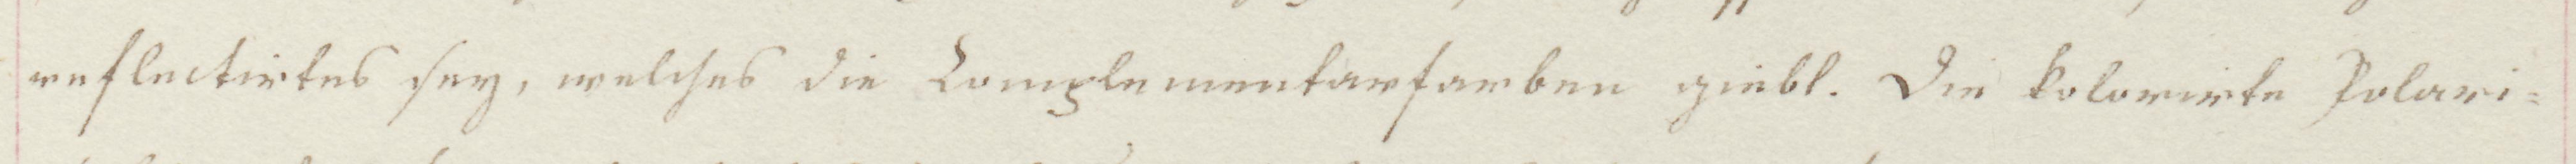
reflectirtes sey, welches die Complementarfarben giebt. Die kolorirte Polari-
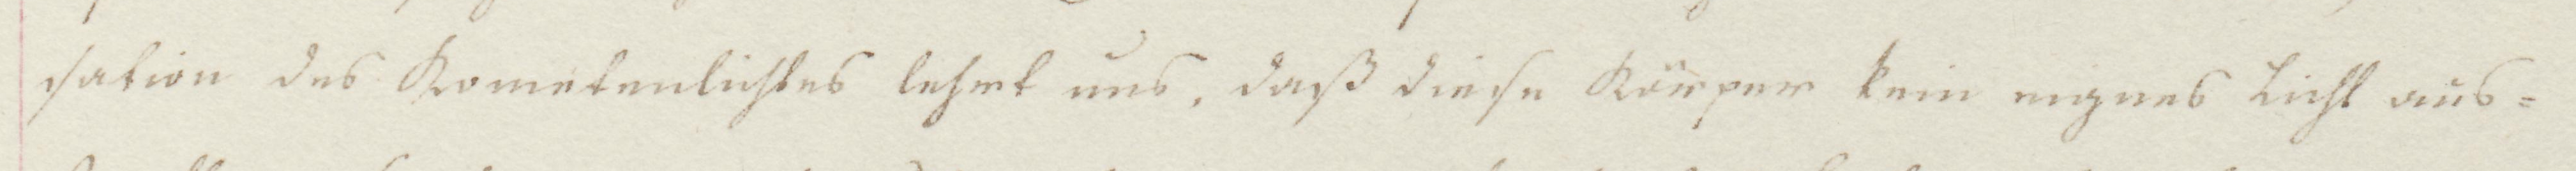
sation des Kometenlichtes lehrt uns, daß diese Körper kein eignes Licht aus-
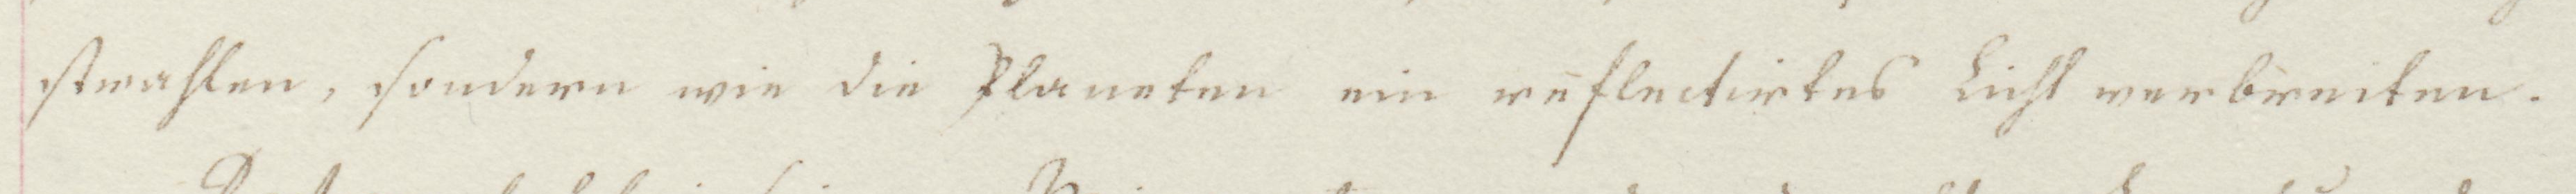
strahlen, sondern wie die Planeten ein reflectirtes Licht verbreiten.
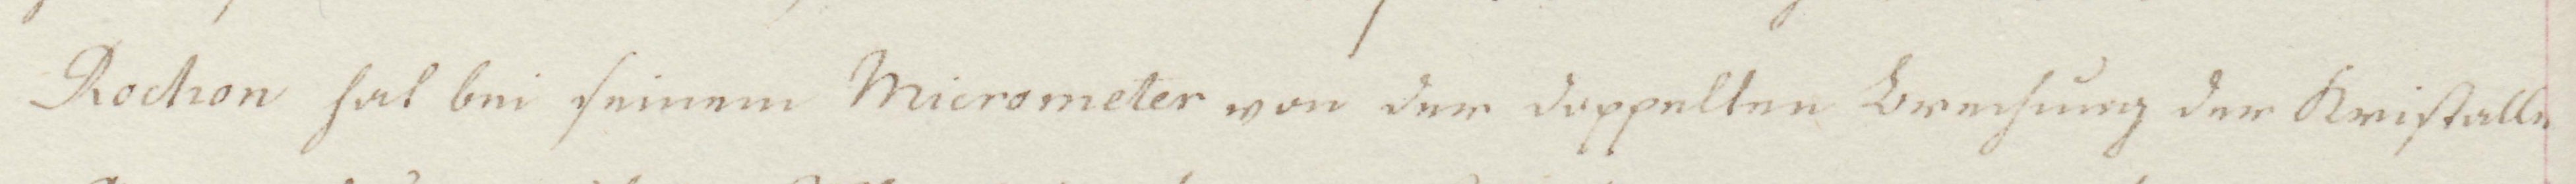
Rochon hat bei seinem Micrometer von der doppelten Brechung der Kristalle
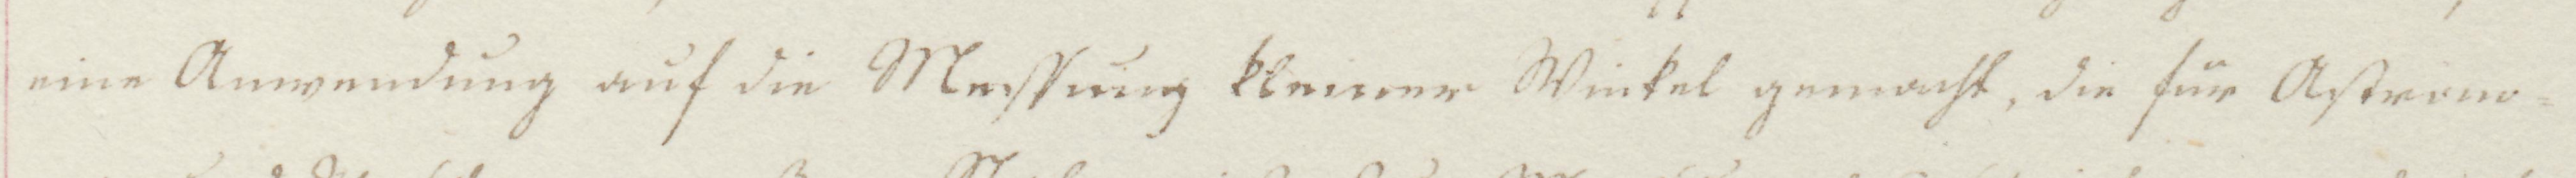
eine Anwendung auf die Messung kleiner Winkel gemacht, die für Astrono-
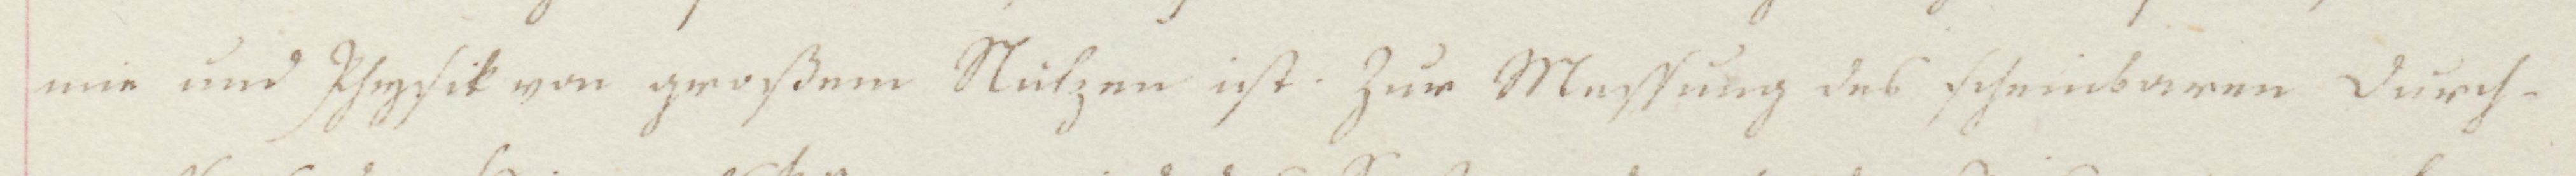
mie und Physik von großem Nutzen ist. Zur Messung des scheinbaren Durch-
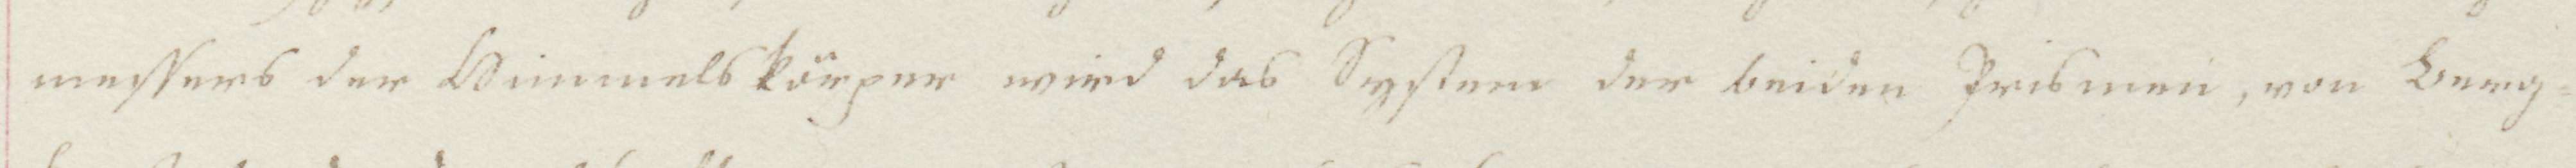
messers der Himmelskörper wird das System der beiden Prismen, von Berg-
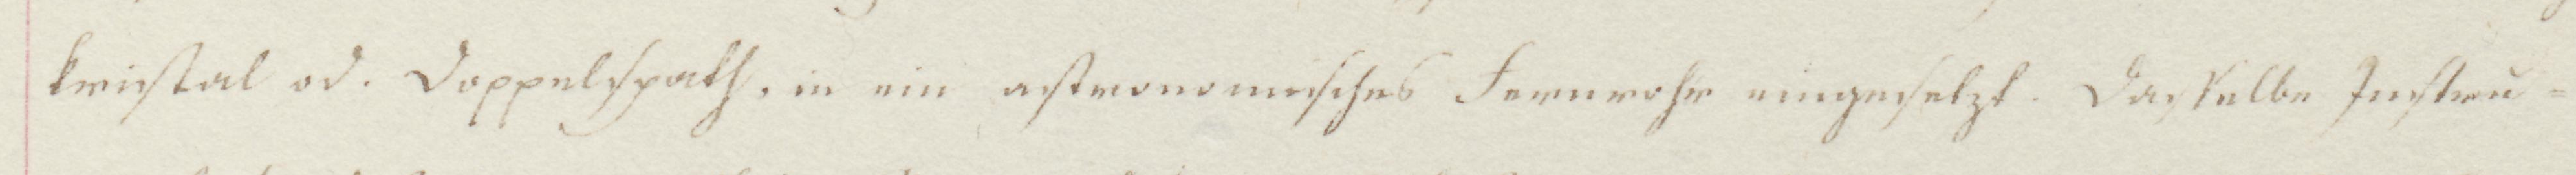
kristal od. Doppelspath, in ein astronomisches Fernrohr eingesetzt. Dasselbe Instru-
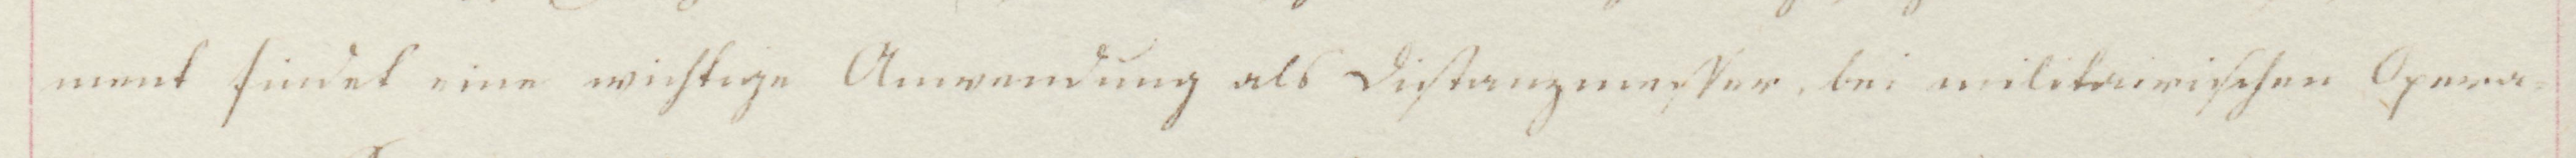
ment findet eine wichtige Anwendung als Distanzmesser, bei militairischen Opera-
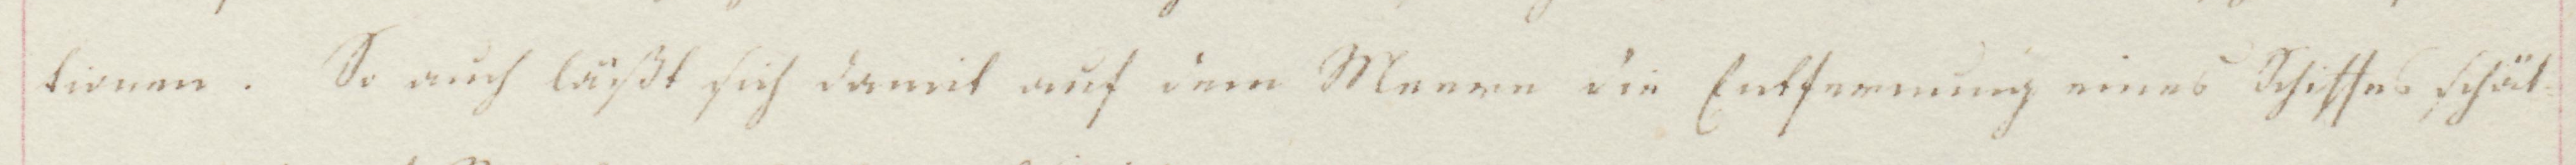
tionen. So auch läßt sich damit auf dem Meere die Entfernung eines Schiffes schät-
